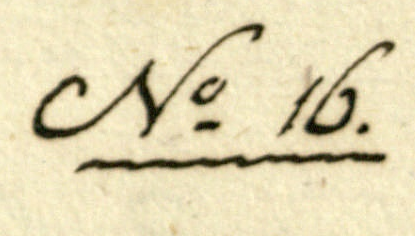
No 16.
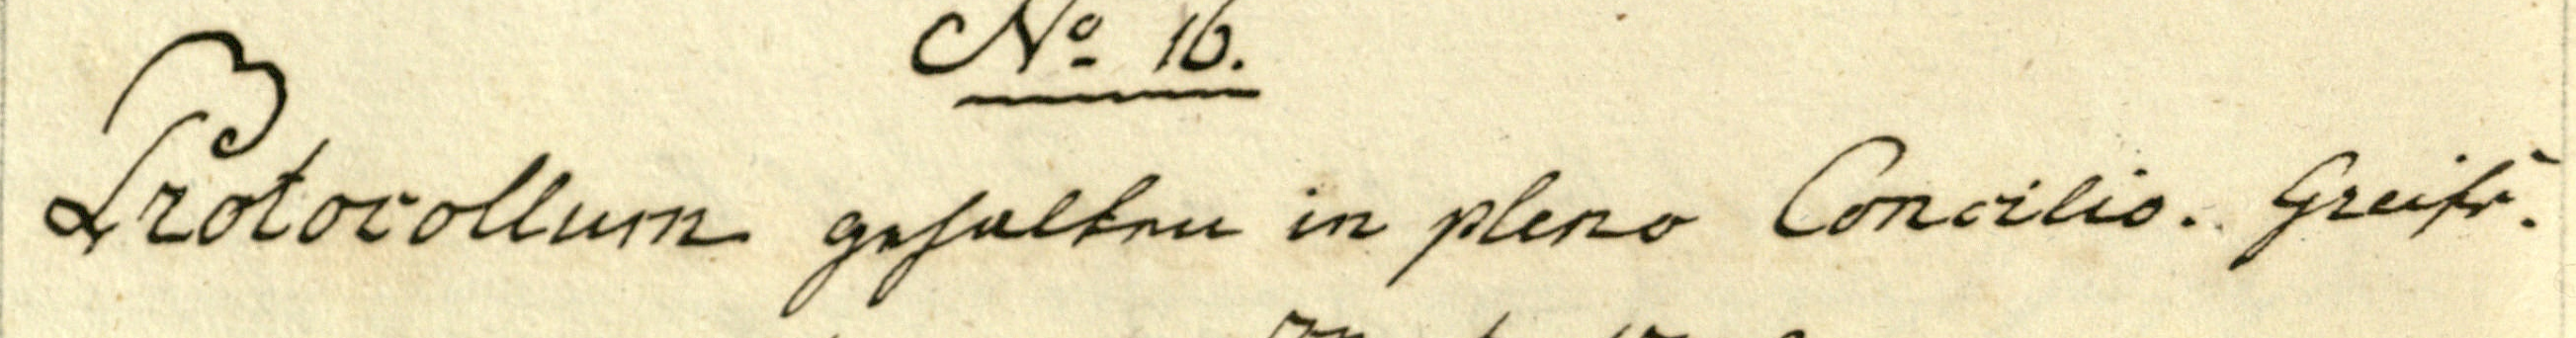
Protocollum. gehalten in pleno Concilio. Greifs¬
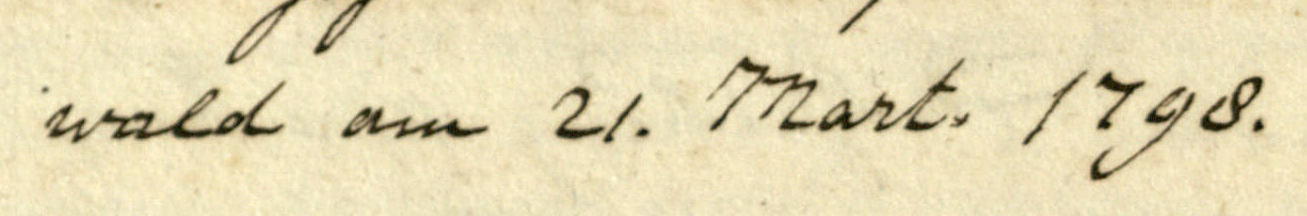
wald am 21. Mart. 1798.
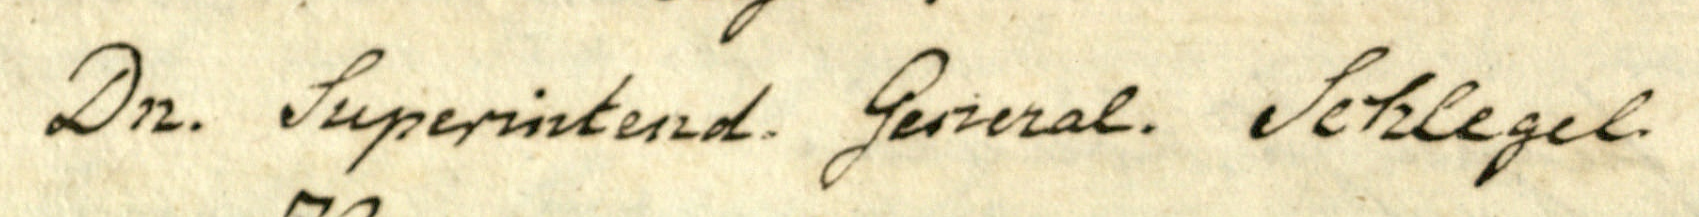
Dn. Superintend. General. Schlegel.
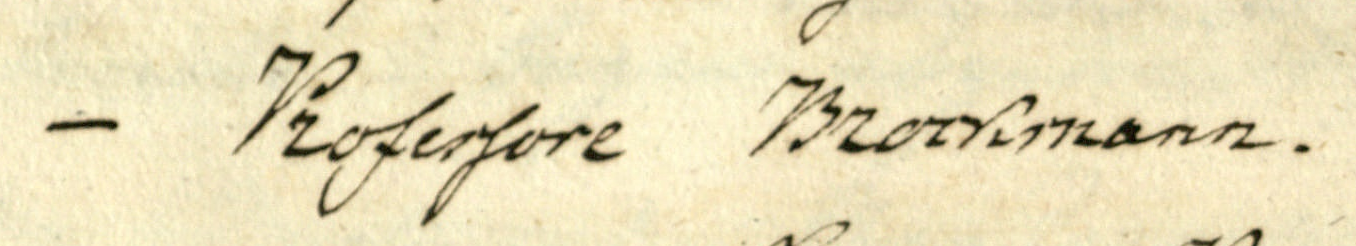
Professore Brockmann.
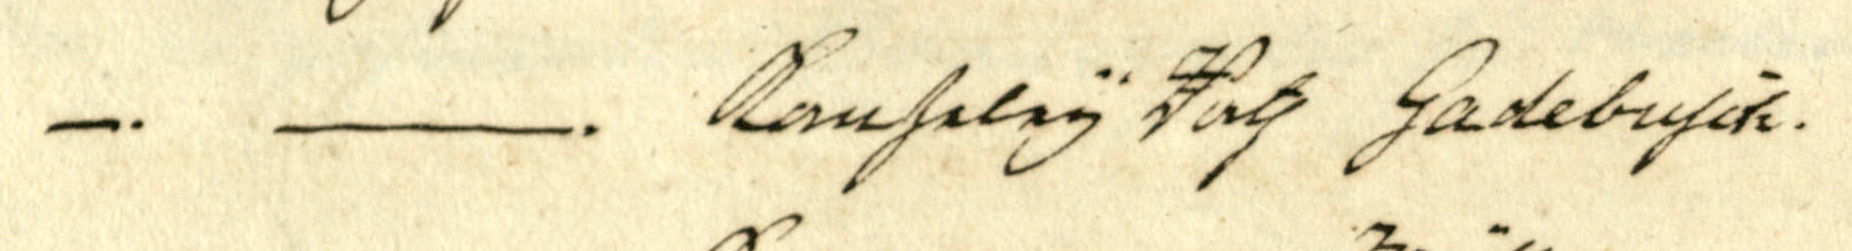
Kanzeleÿ Rath Gadebusch.
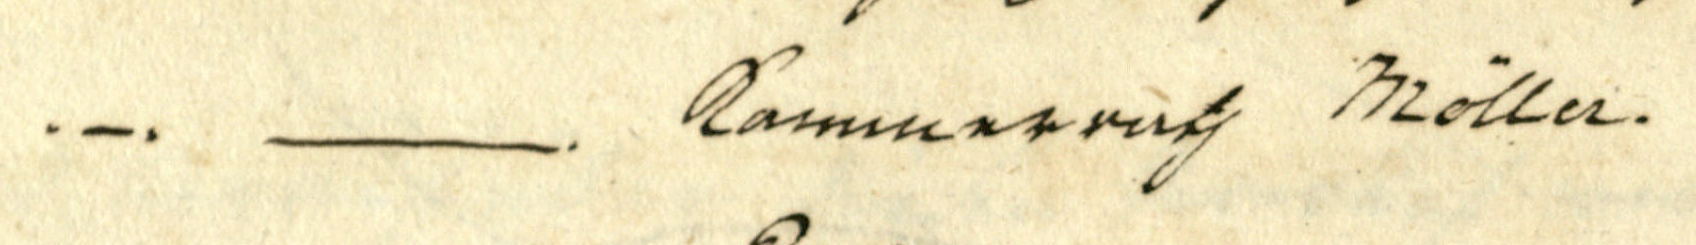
Kammerrath Möller.
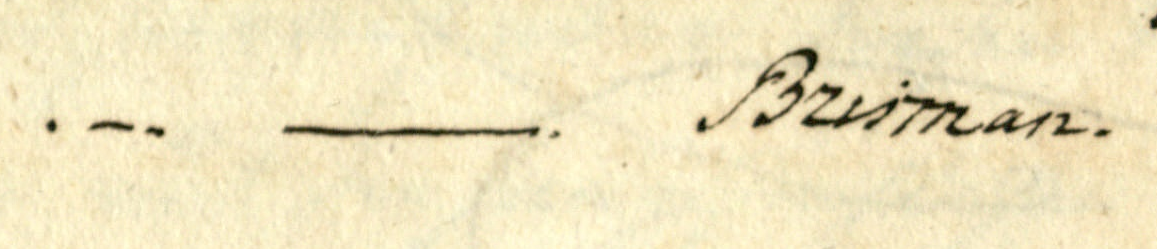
Brisman.
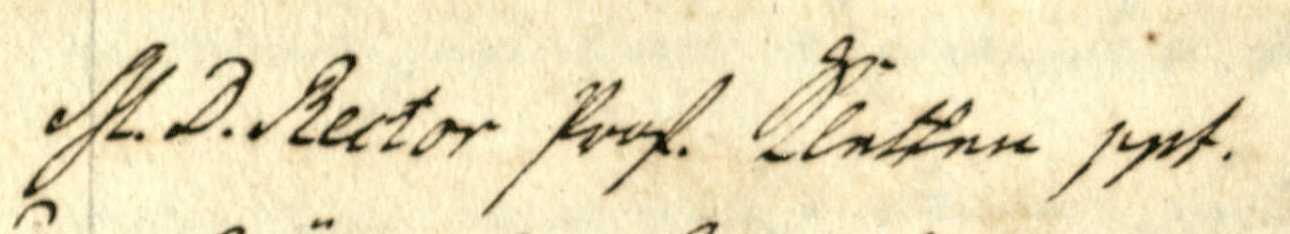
M. D. Rector Prof. Kletten ppt.
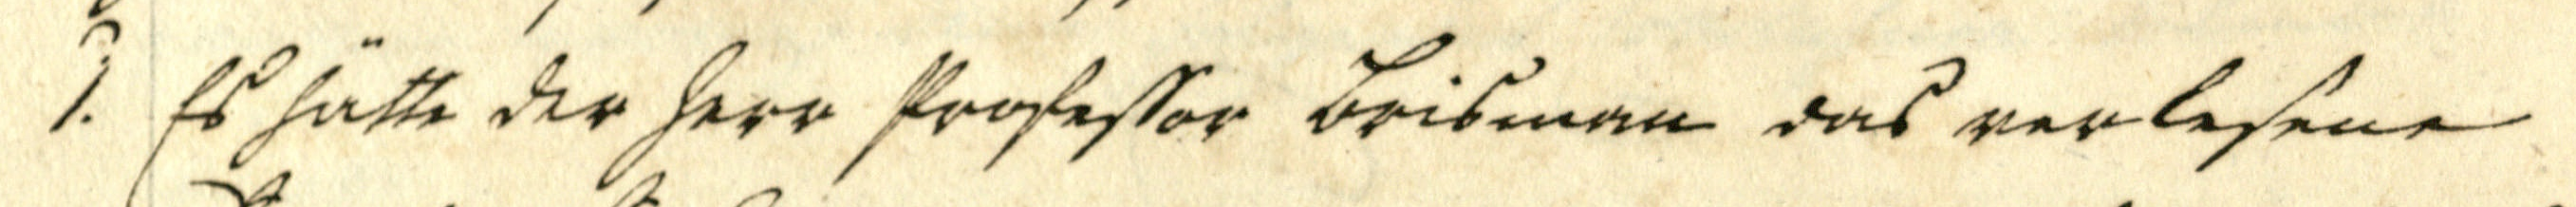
1. Es hätte der Herr Professor Brisman das verlesene
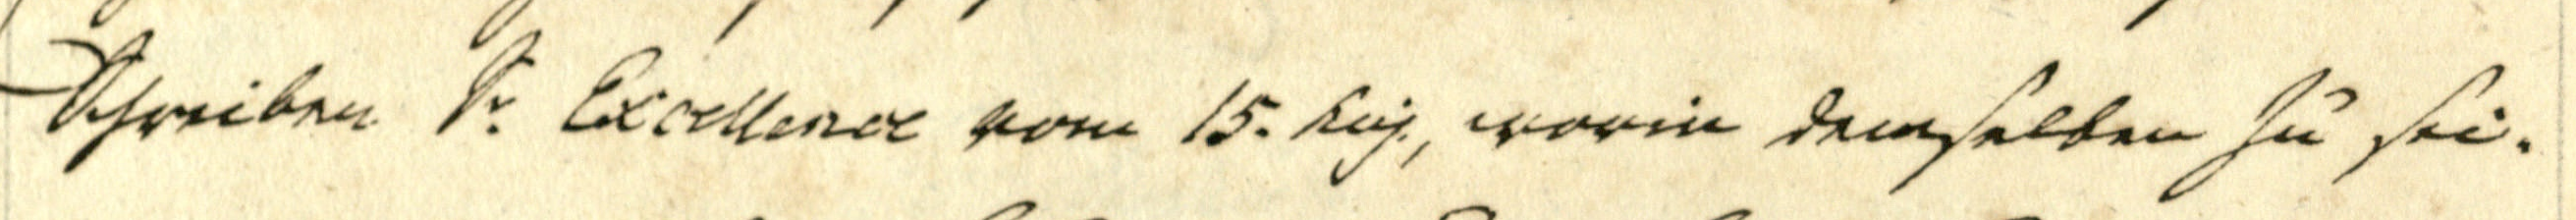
Schreiben Sr. Excellence vom 15. huj, worin demselben zu sei¬
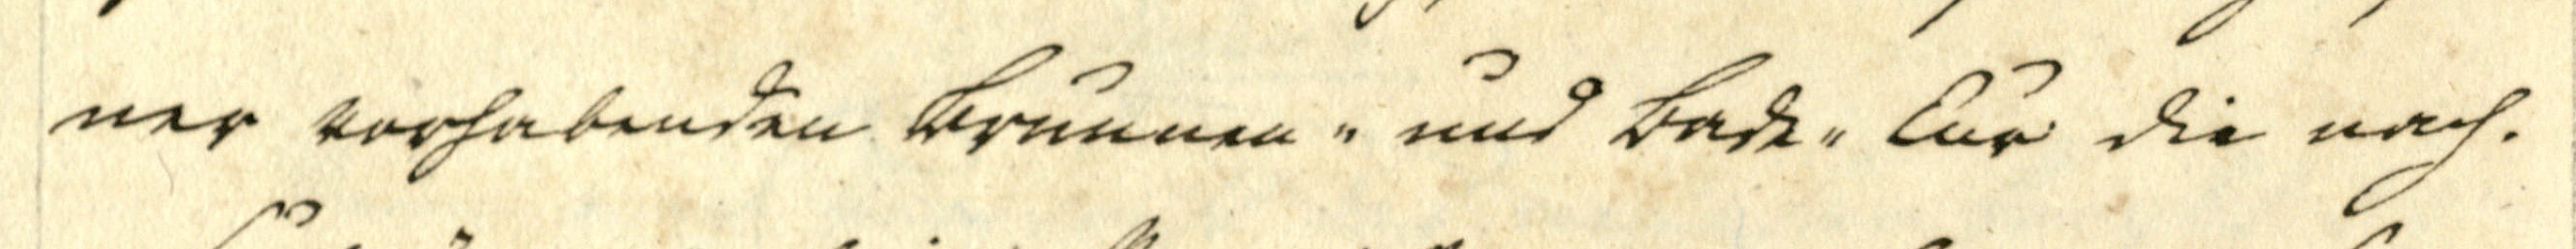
ner vorhabenden Brunnen- und Bade-Cur die nach¬
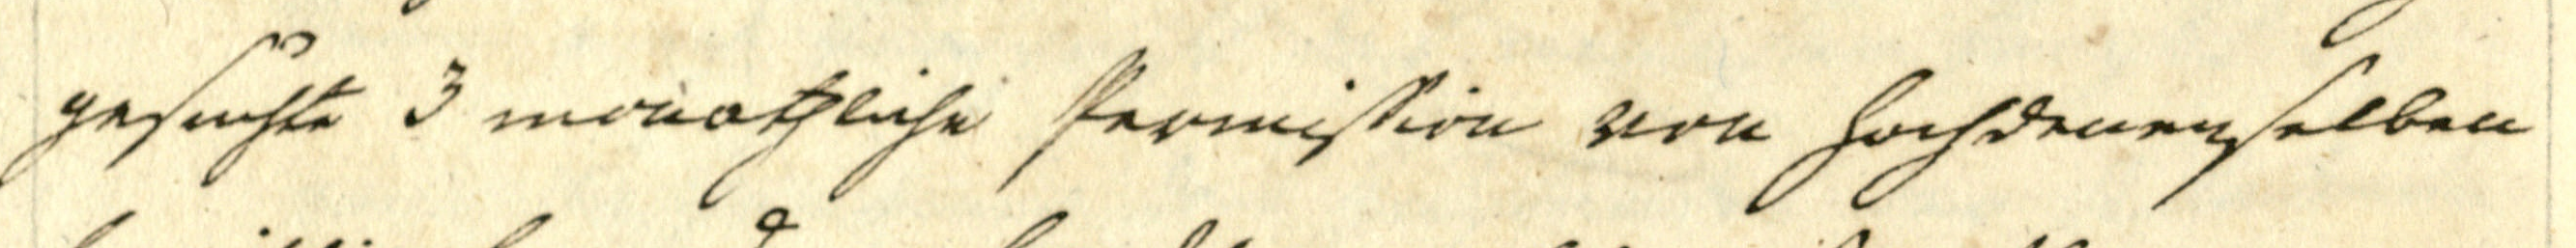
gesuchte 3 monathliche Permission von Hochdenenselben
